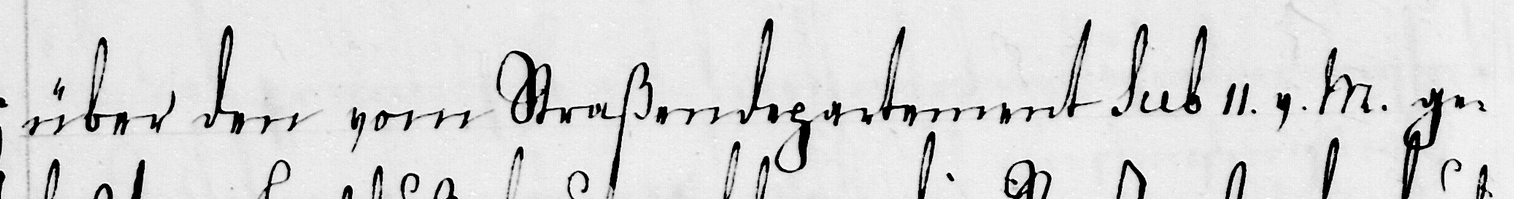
über den vom Straßendepartement sub 11. v. M. ge¬
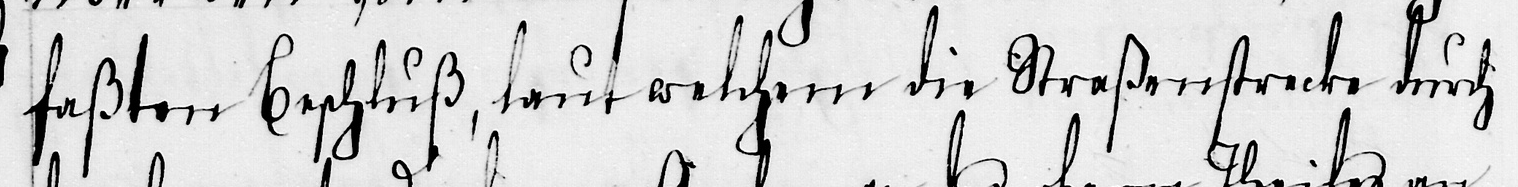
faßten Beschluß, laut welchen die Straßenstrecke durch
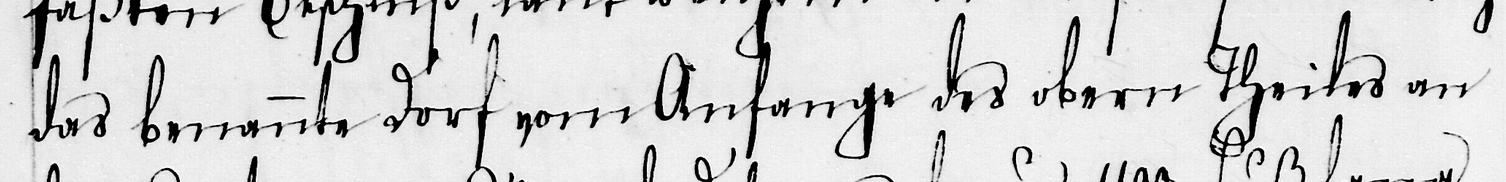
das benannte Dorf vom Anfange des obern Theiles an
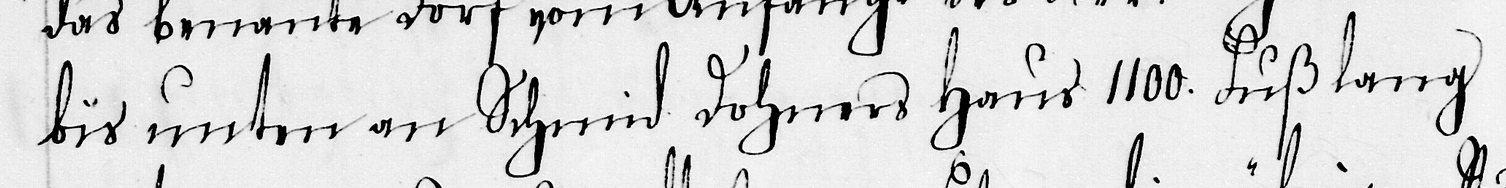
bis unten an Schmid Dohners Haus 1100. Fuß lang
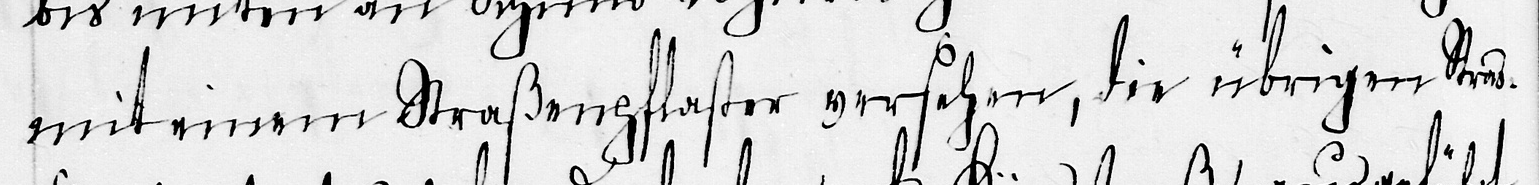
mit einem Straßenpflaster versehen, die übrigen Stra¬
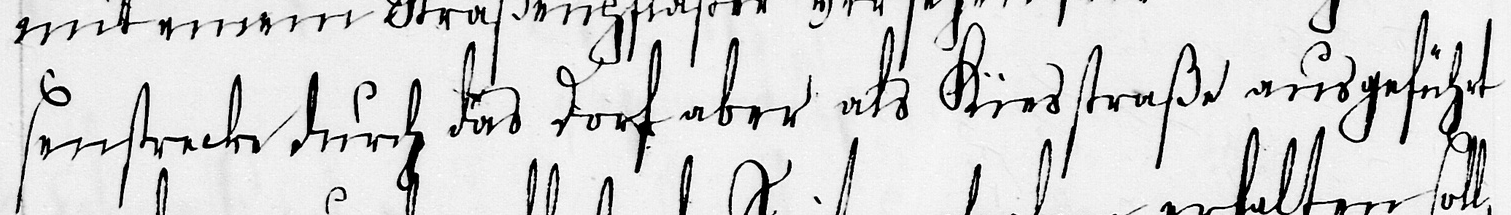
ßenstrecke durch das Dorf aber als Kiesstraße ausgeführt
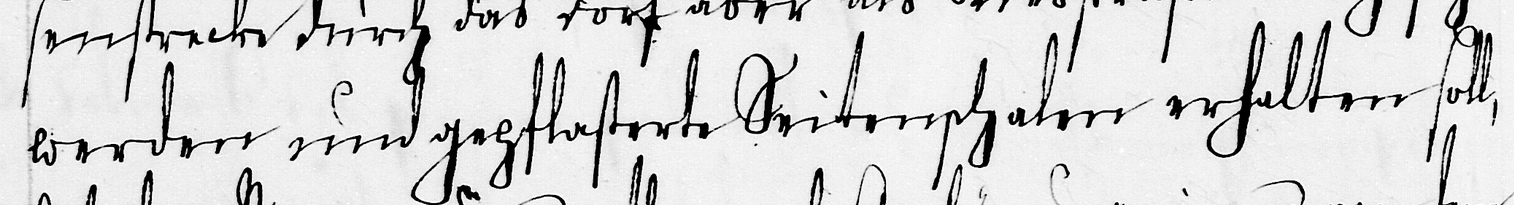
werden und gepflasterte Seitenschalen erhalten sol¬
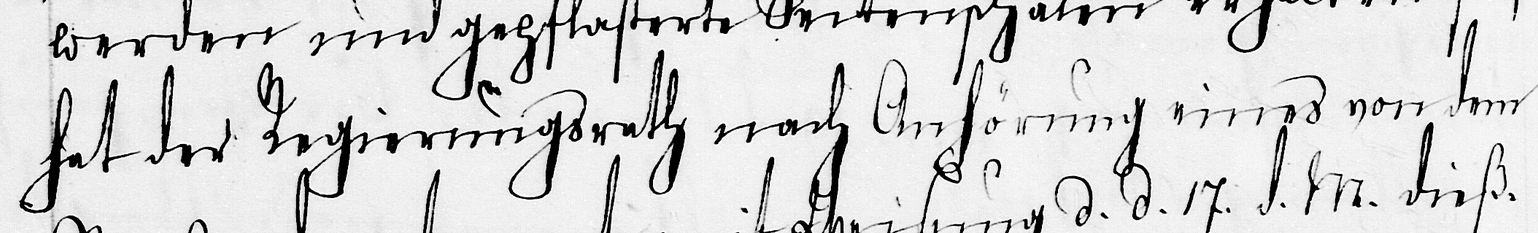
hat der Regierungsrath nach Anhörung eines von dem
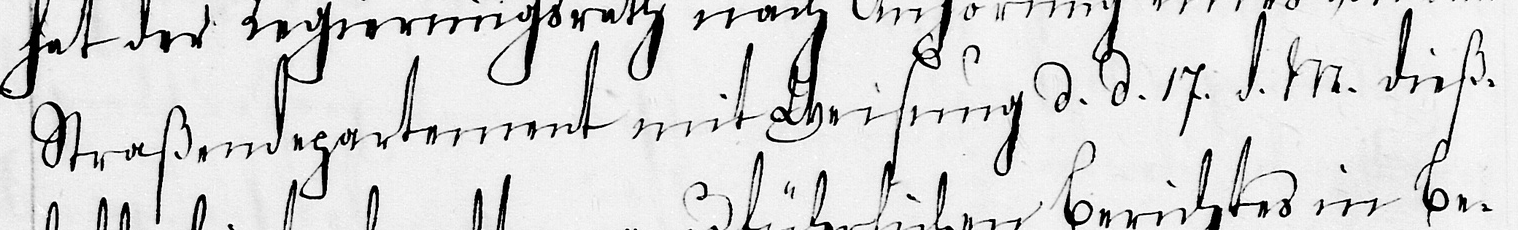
Straßendepartement mit Weisung d. d. 17. d. M. dieß¬
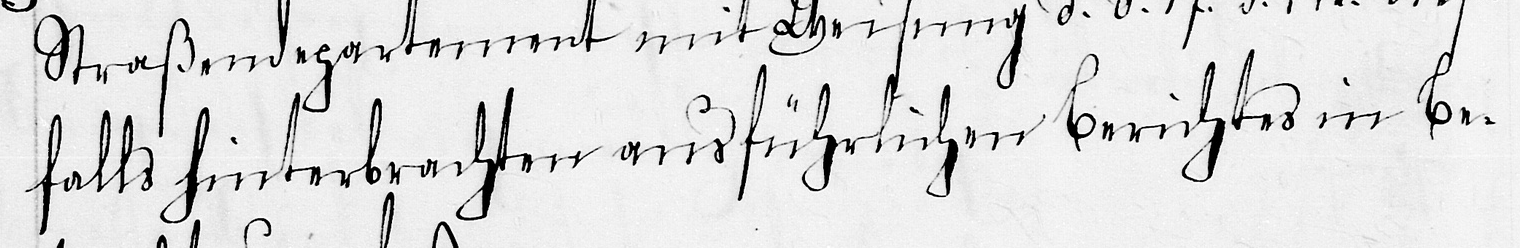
falls hinterbrachten ausführlichen Berichtes in Be¬
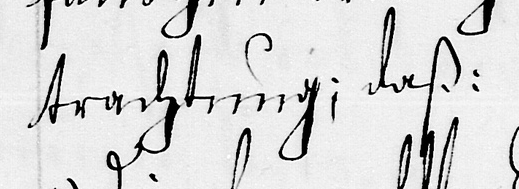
trachtung; daß:
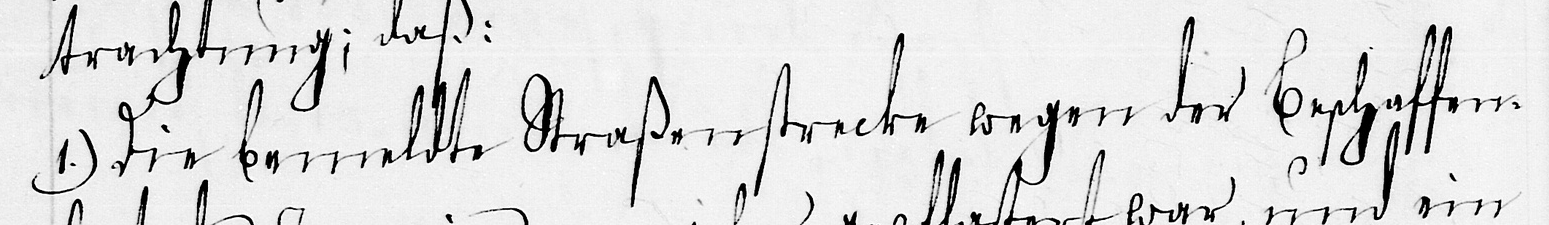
1.) Die bemeldte Straßenstrecke wegen der Beschaffen¬
